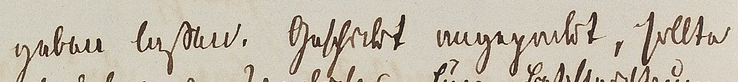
geben lassen. Geschickt angepackt, sollte
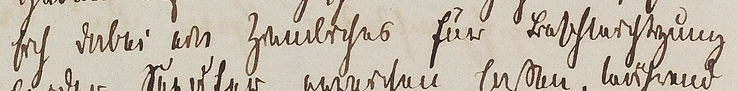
sich dabei ein Ziemliches für Beschwichtigung
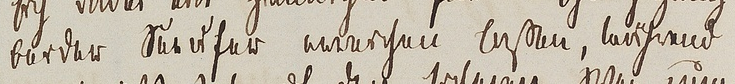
beider Seeufer erreichen lassen, während
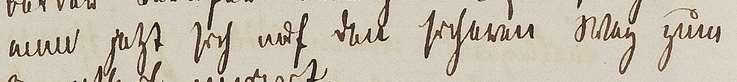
eine jetzt sich auf den sicheren Weg zum
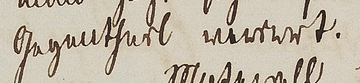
Gegentheil verirrt.
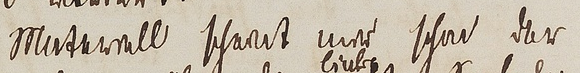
Materiell scheint mir schon der
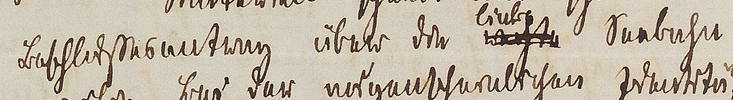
Beschlussesantrag über die rechtelinke Seebahn
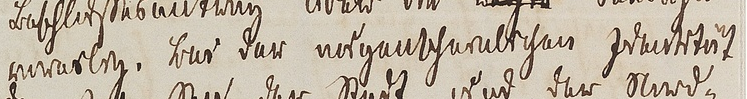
voreilig. Bei der augenscheinlichen Identität
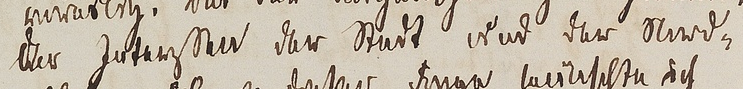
der Interessen der Stadt und der Nord-
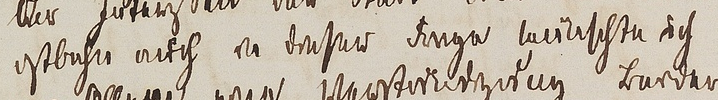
ostbahn auch in dieser Frage wünschte ich
